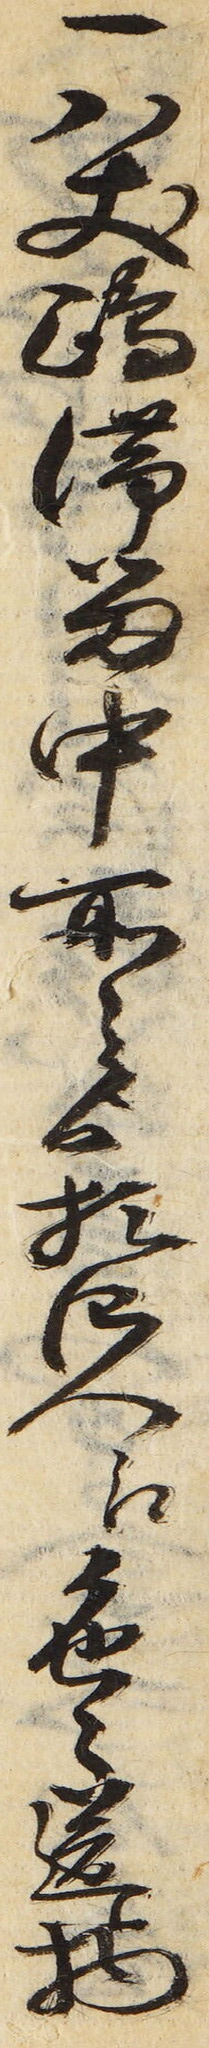一八丈嶋滞留中所々ゟ拾四人江色々送物
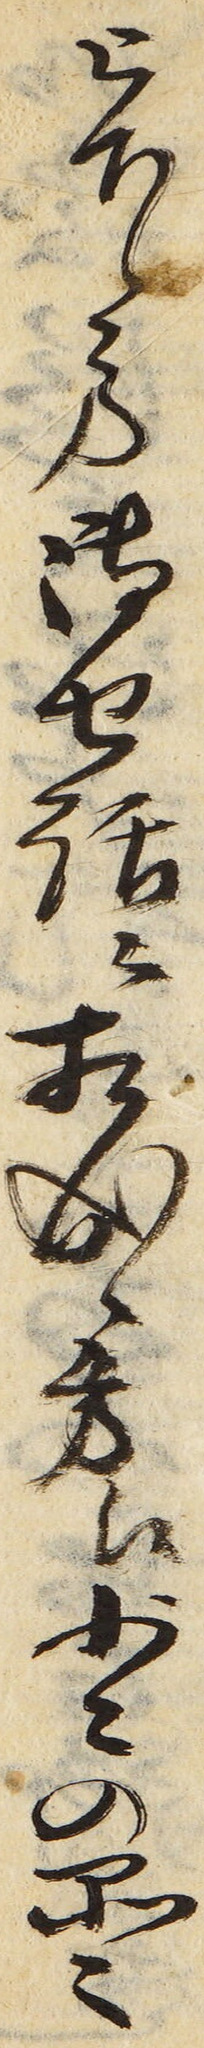被下候方御世話ニ相成候方江少々の品々
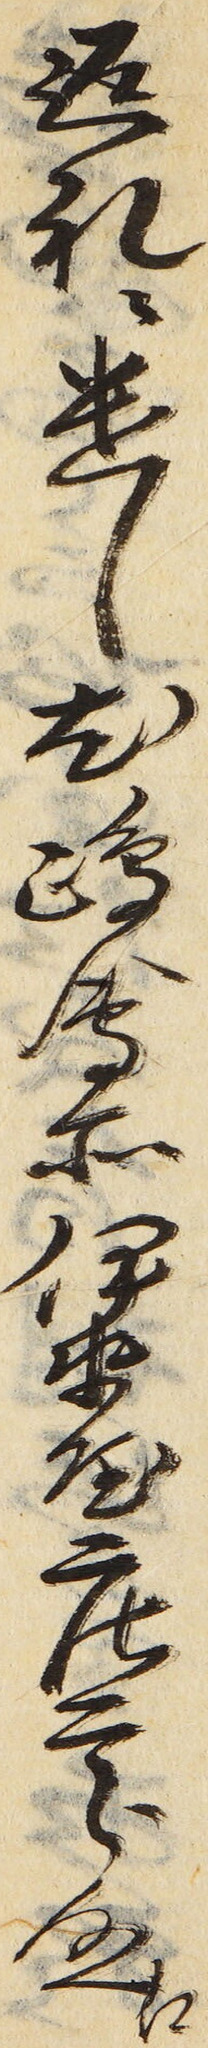返礼ニ遣し候尤嶋会所伊勢屋庄二郎殿江
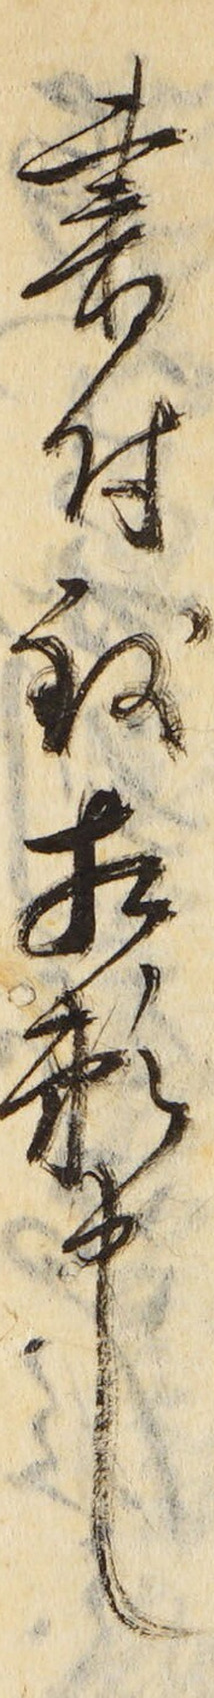書付致相頼申候
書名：漂流一件上書
